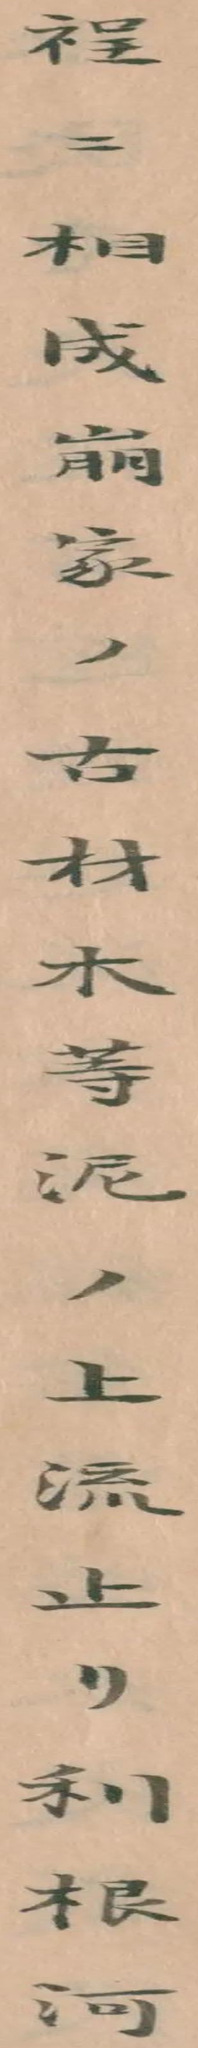程二相成崩家ノ古材木等泥ノ上流止り利根河
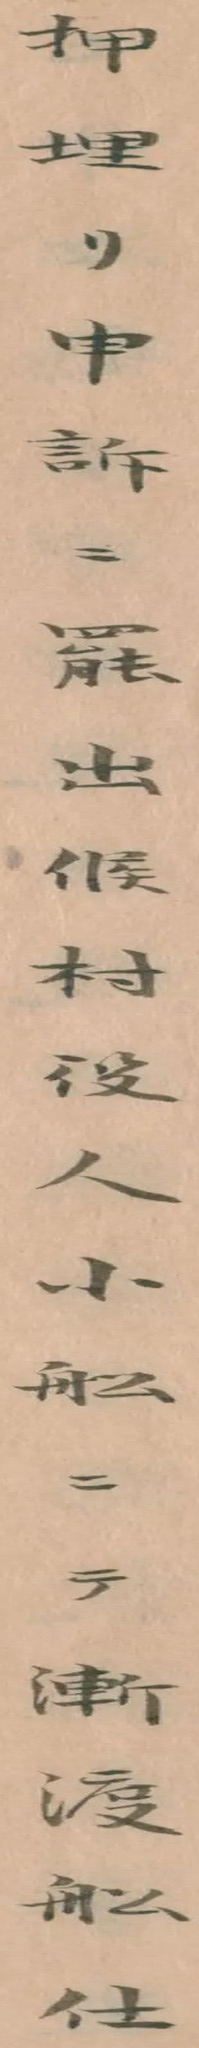押埋り申訴二罷出候村役人小船ニテ漸渡船仕
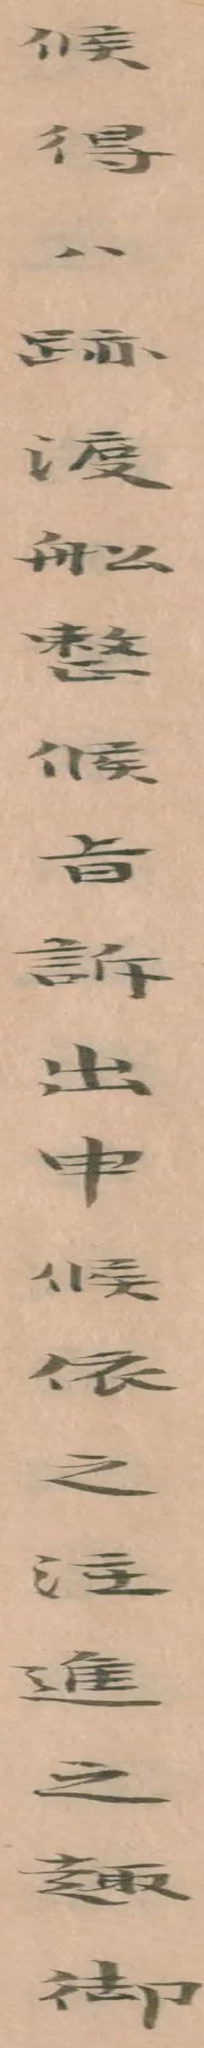候得ハ跡渡船整候旨訴出申候依之注進之趣御
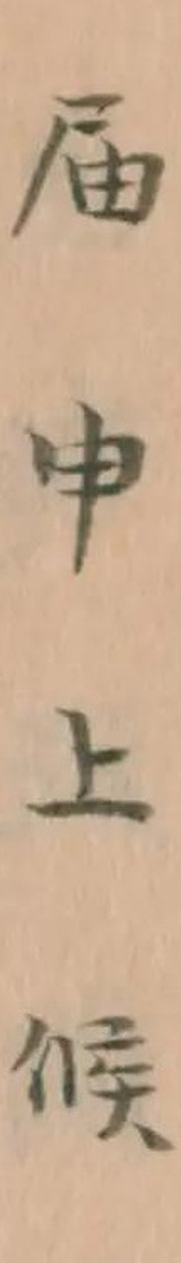届申上候
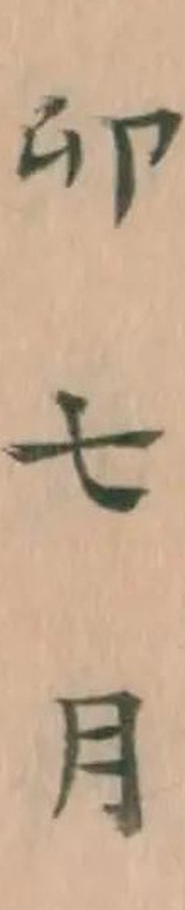卯七月
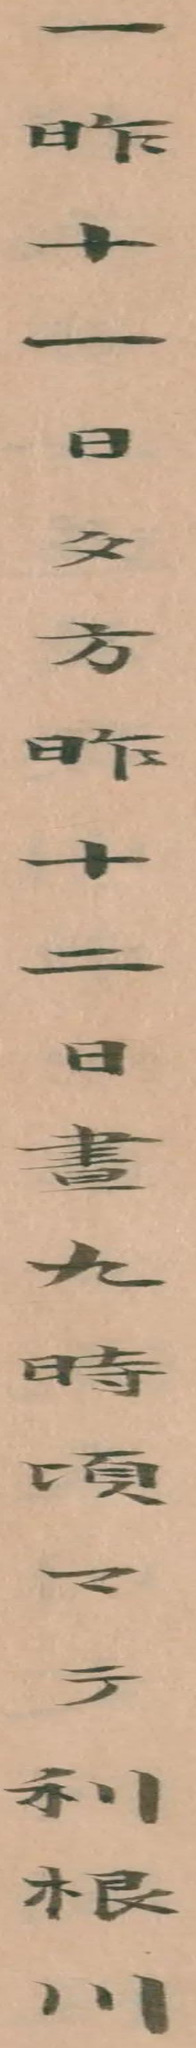一昨十一日夕方昨十二日晝九時頃マテ利根川
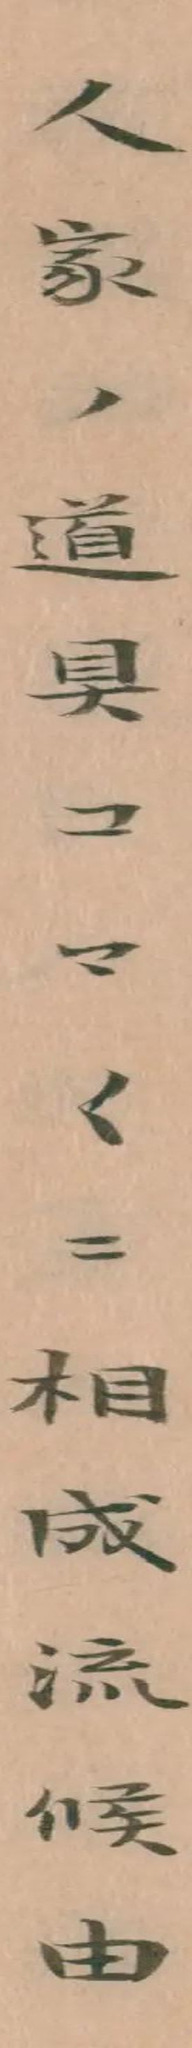人家ノ道具コマ〳〵二相成流候由
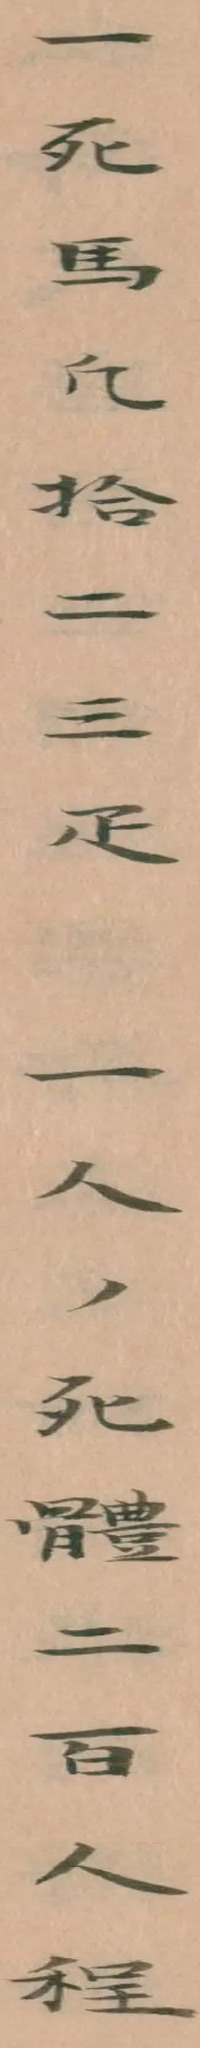一死馬凡拾二三疋一人ノ死体二百人程
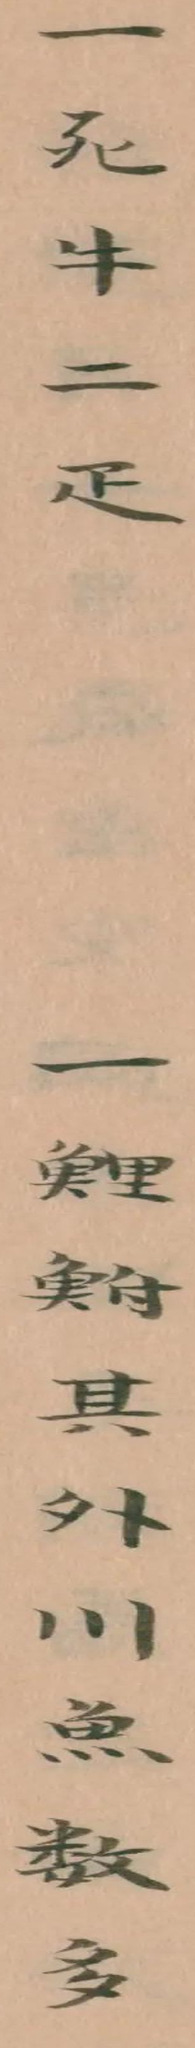一死牛二疋一鯉鮒其外川魚数多
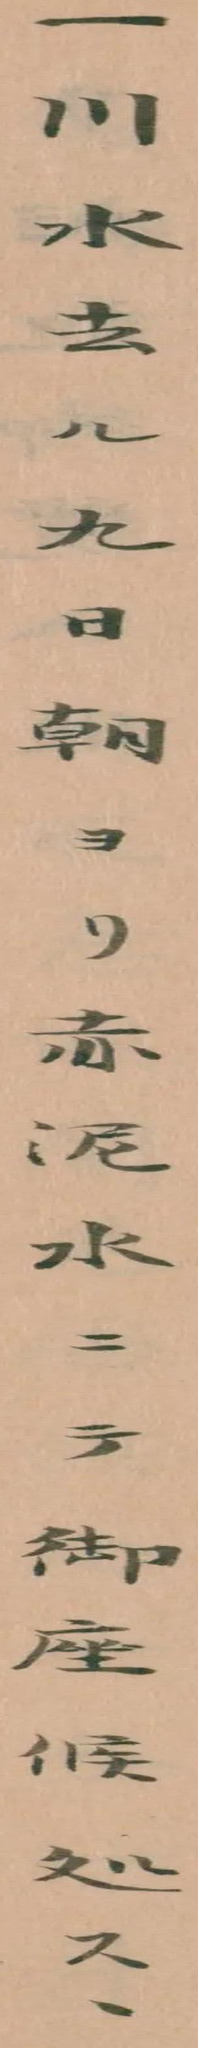一川水去ㇽ九日朝ヨリ赤泥水ニテ御座候処スゝ
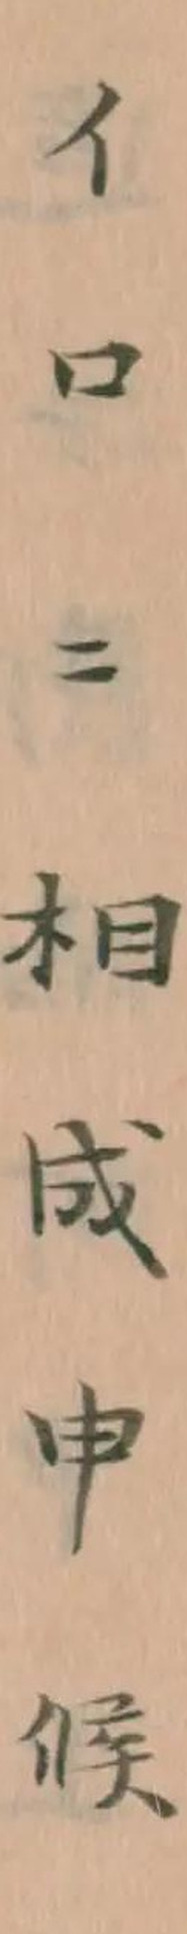イロ二相成申候
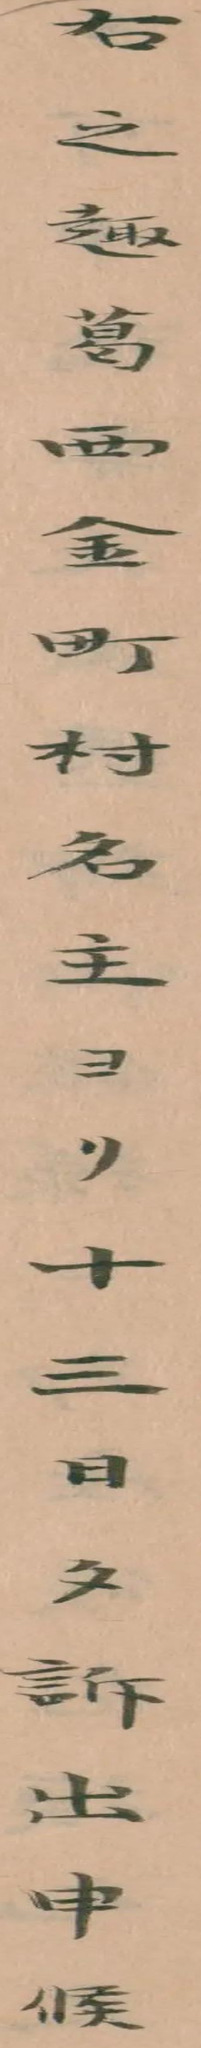右之趣葛西金町村名主ヨリ十三日夕訴出申候
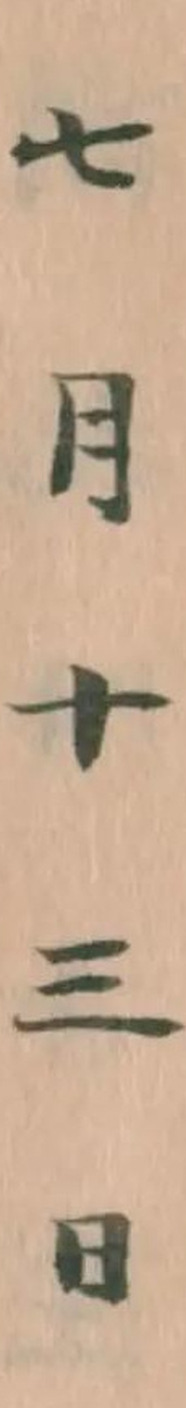七月十三日
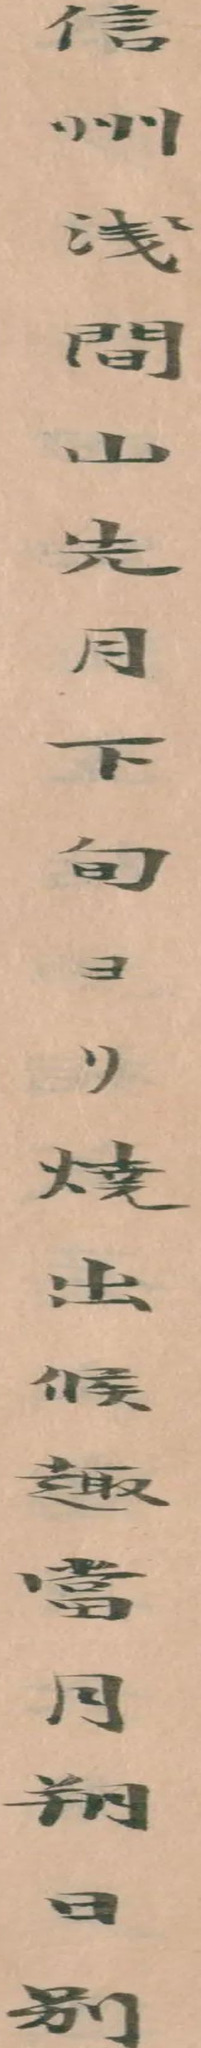信州浅間山先月下旬ヨリ焼出候趣当月朔日別
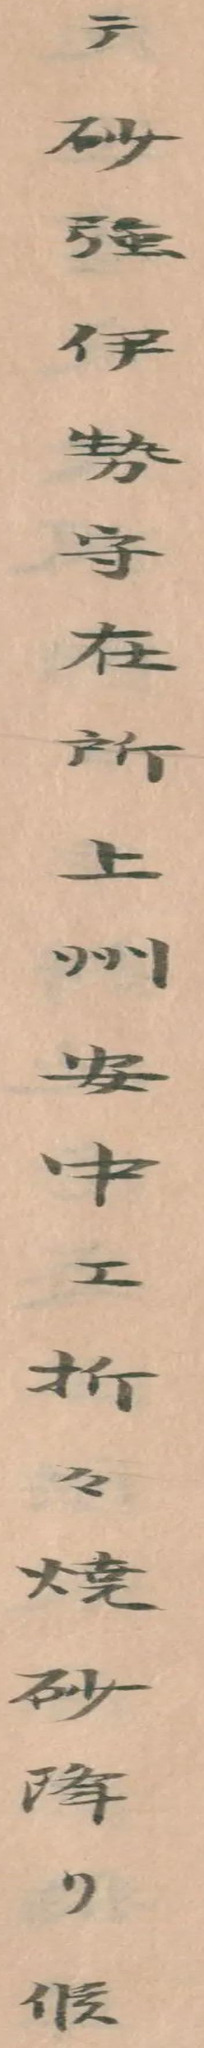テ砂強伊勢守在所上州安中エ折々焼砂降り候
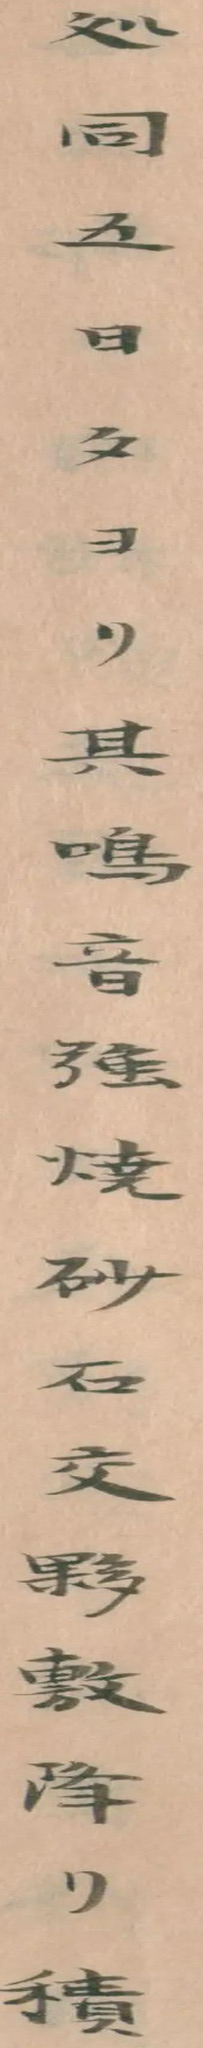処同五日夕ヨリ其鳴音強焼砂石交夥敷降り積
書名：地災撮要. 巻1(噴火山・地震ノ部)
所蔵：国立国会図書館 National Diet Library, JAPAN
